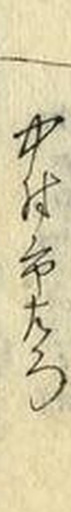中村市右衛門
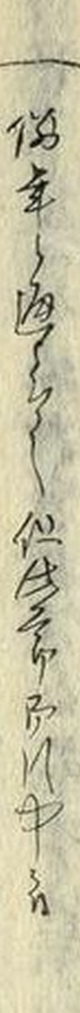例年之通被下之但此節御引中ニ付
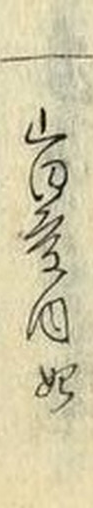山田藤内始
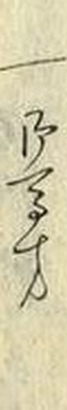御馬方
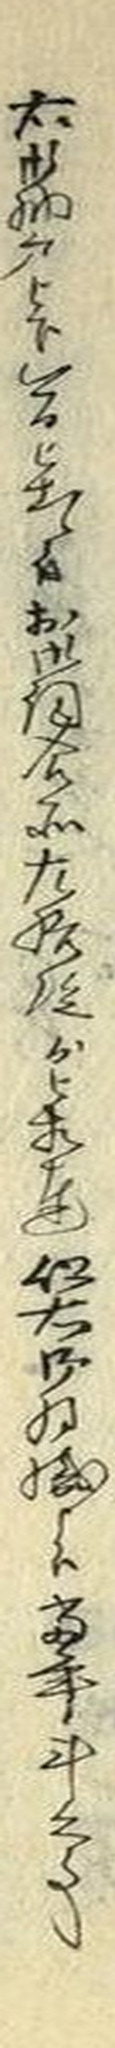右御納戸被下今日被出候ニ付於御調合所左膳殿ゟ被相達但右御羽織被下当年斗之事
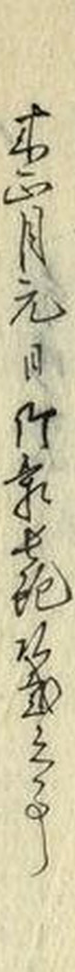来正月元日御影長鮑頂戴之事
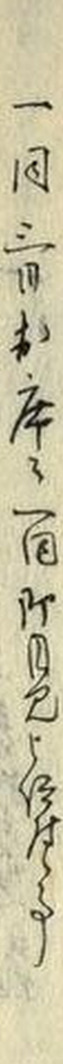一同三日於席々一同御目見被仰付候事
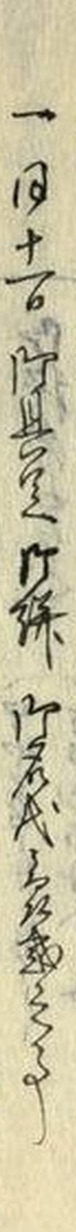一同十一日御具足御餅御名代ニ而頂戴之事
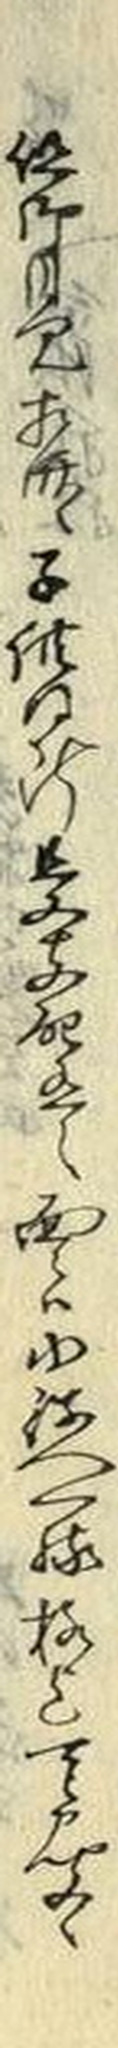但御目見相済候子供同断且又支配有之面々ハ小役人一統格迄可被申聞候
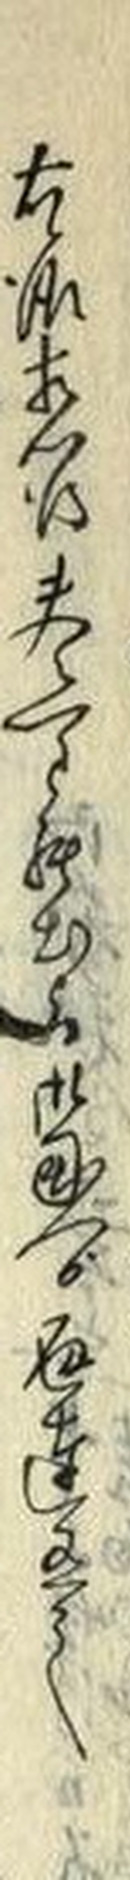右之趣相心得夫々可被罷出旨御用人ゟ通達有之
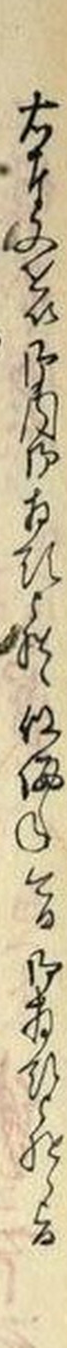右奉文を以御内御拝領被遊候但例年今日御拝領被遊候旨
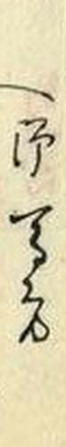御馬方
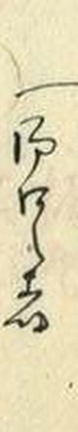御口之者
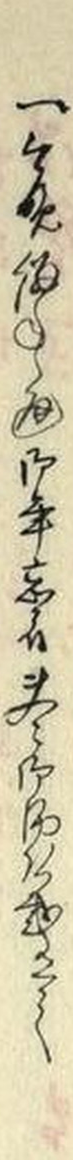一今晩例年之通御年忘ニ付夫々御酒頂戴有之
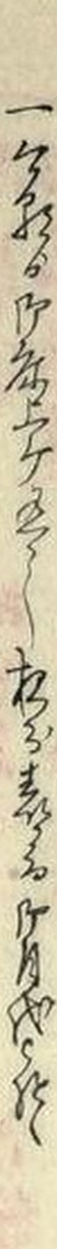一今朝ゟ御床上ケ有之夜分表ニ而御月代被遊候
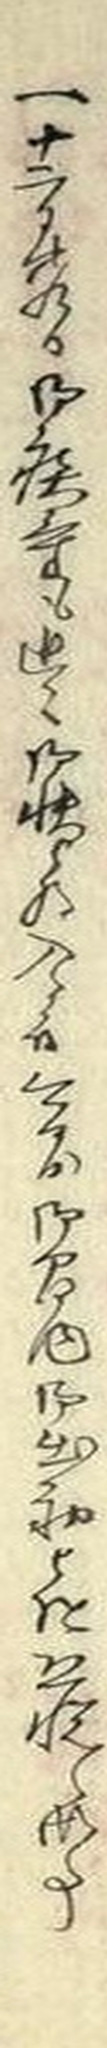一十二月廿九日御疾気も追々御快被為入候ニ付今日ゟ御間内御出勤被遊恐悦之御事
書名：少傅日録抄（斉善付側向頭取日記、在府）
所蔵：福井県文書館 Fukui Prefectural Archives
